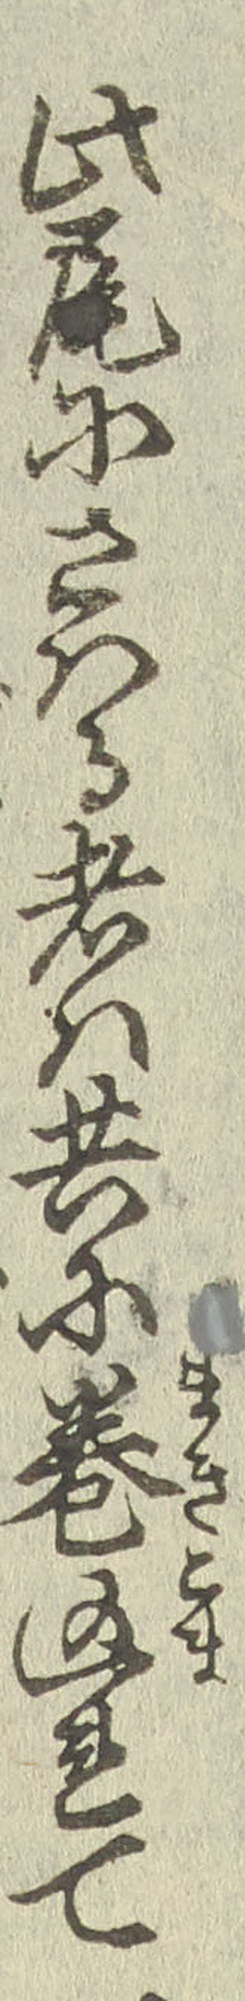此尾にさはる者は共に巻込れて
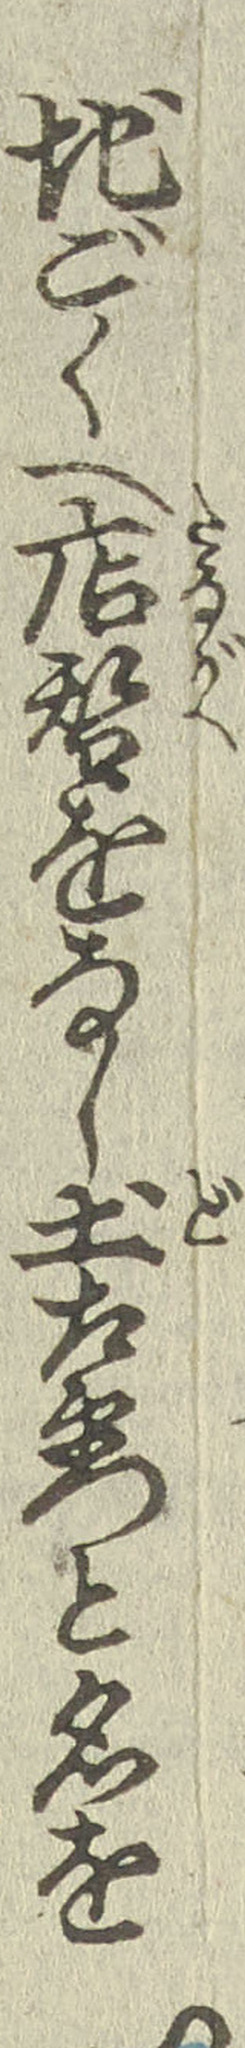地ごくへ店替をなし土左衛門と名を
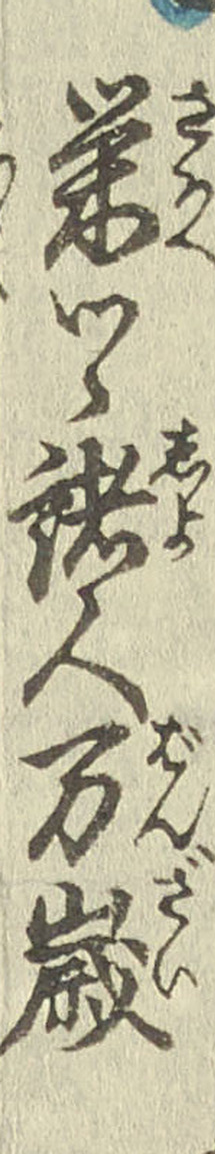栄つゝ諸人万歳
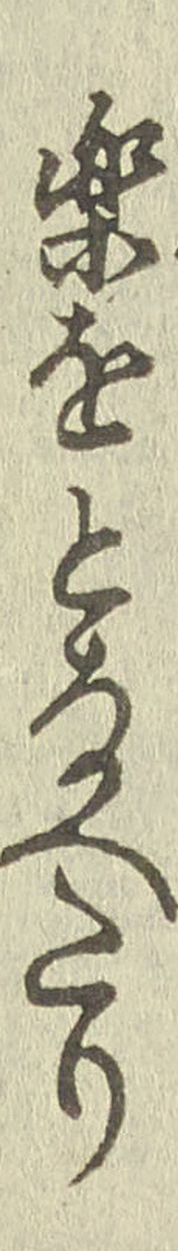楽をとなへたり
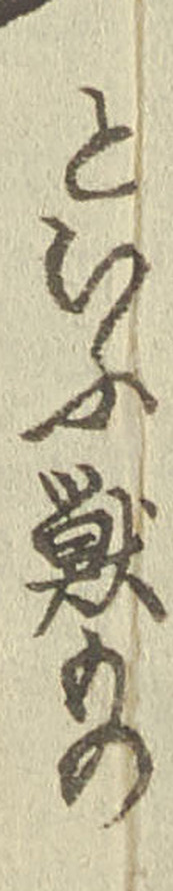といふ獣もの
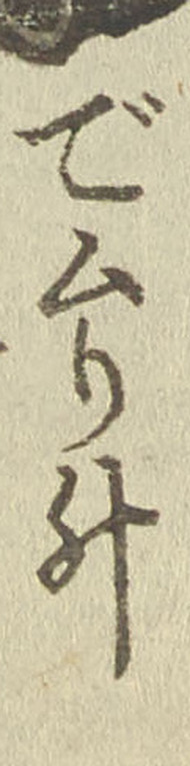で厶り升
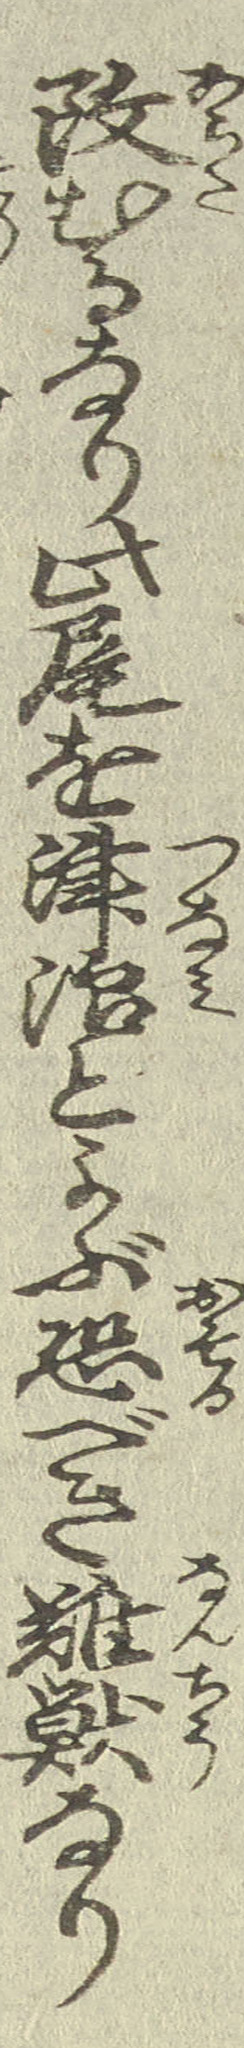改むるなり此尾を津浪とよぶ恐べき難獣なり
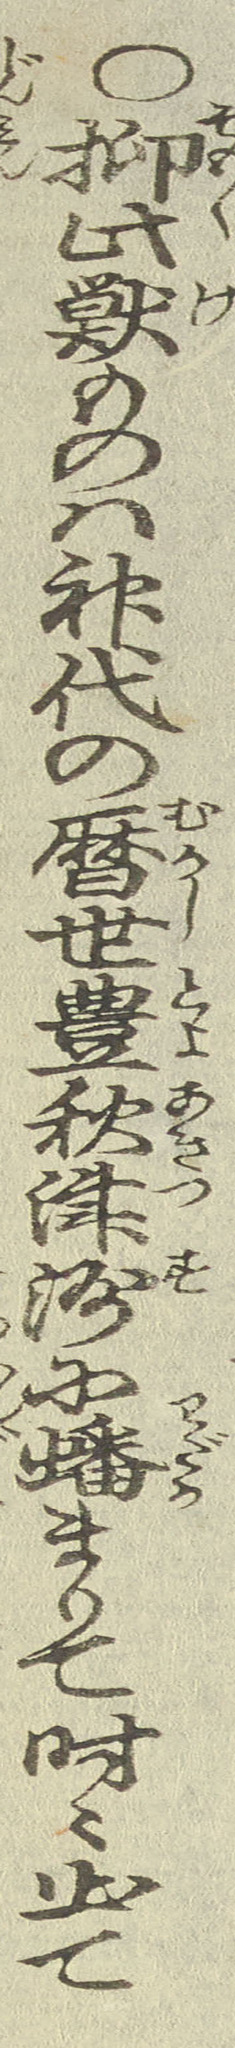○抑此獣ものは神代の暦世豊秋津洲に蟠まりて時々出て
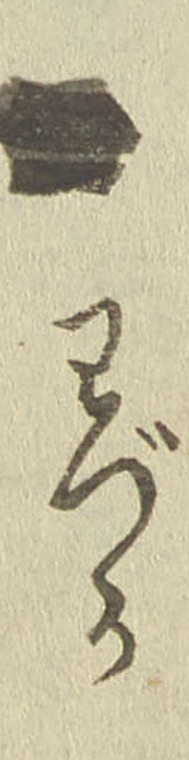わづか
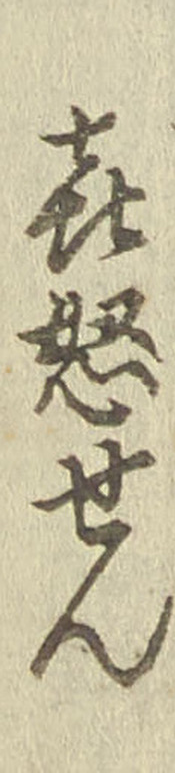喜怒せん
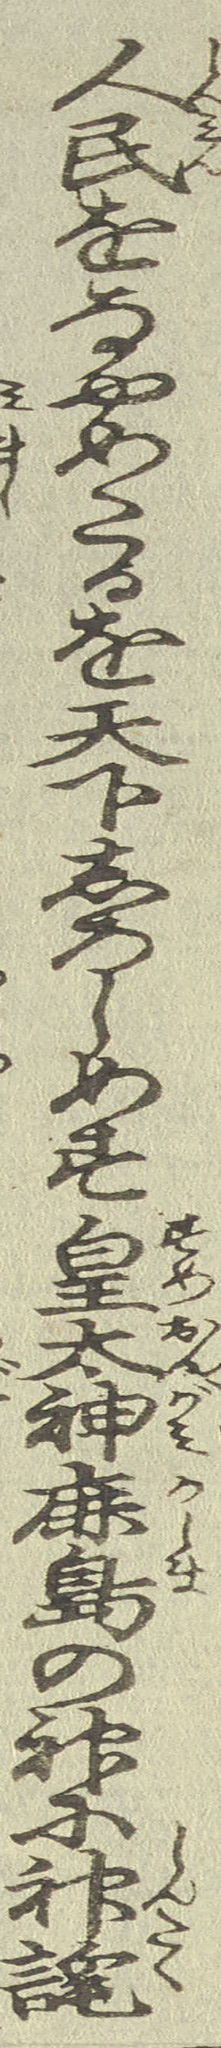人民をなやめたるを天下しろしめす皇太神鹿島の神に神詫
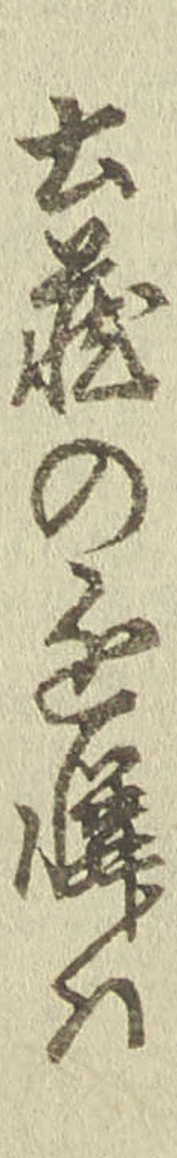土蔵の近隣は
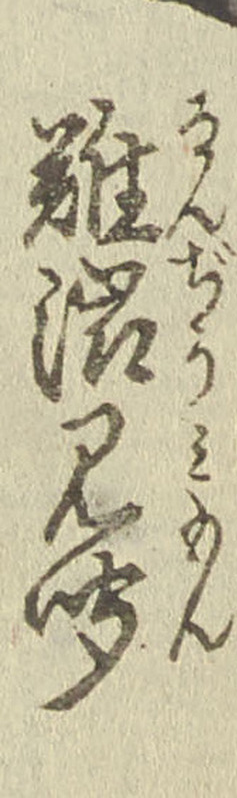難渋見聞
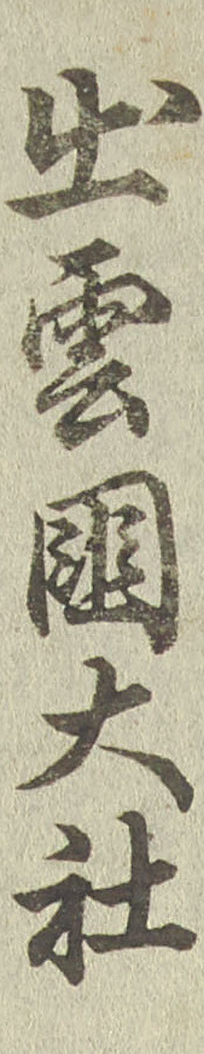出雲國大社
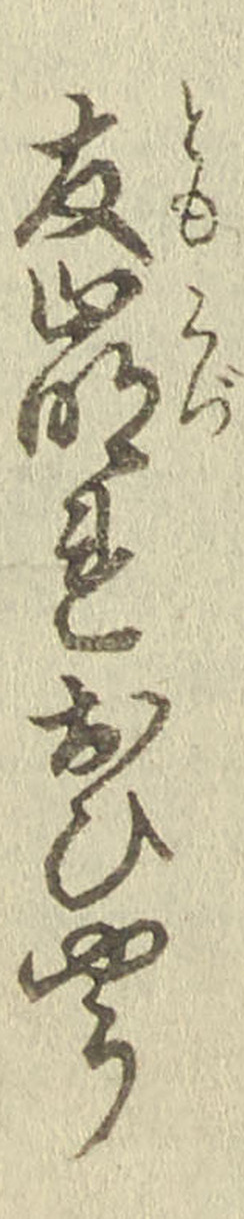友崩れおひやう
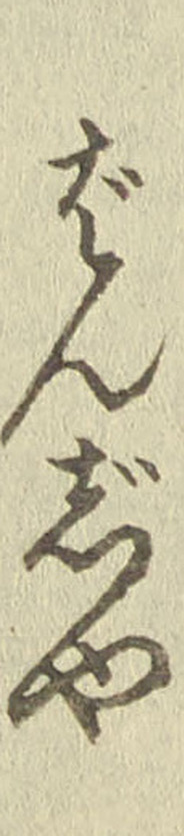ばんじや
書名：上方震下り瓢磐鯰の化物 一名難獣といふ
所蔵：東京大学総合図書館 General Library in the University of Tokyo, JAPAN
